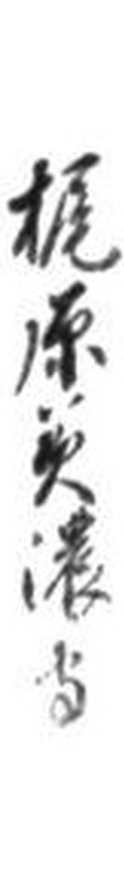梶原美濃守
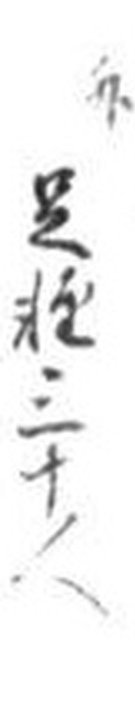足軽三十人
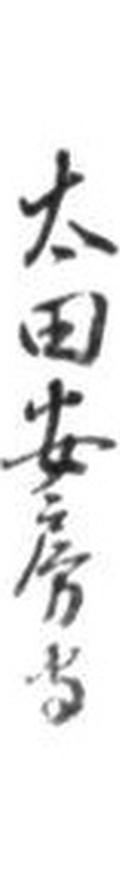太田安房守
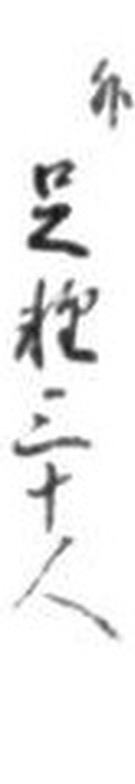足軽三十人
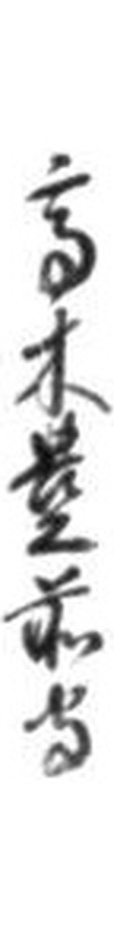高木豊前守
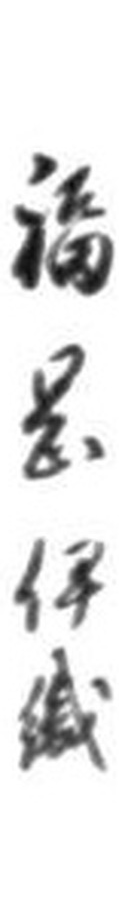福岡伊織
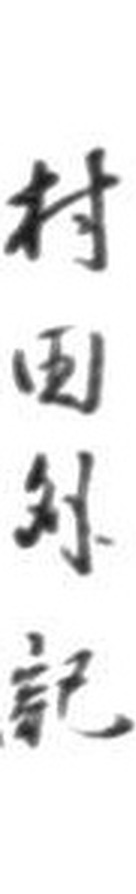村田外記
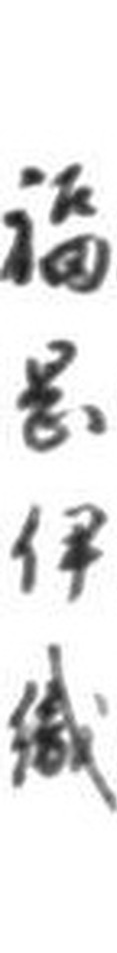福岡伊織
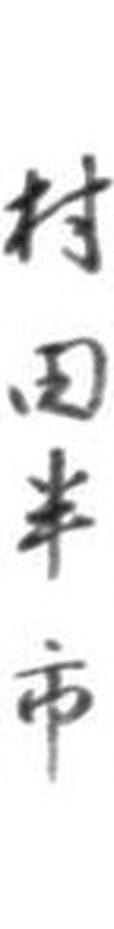村田半市
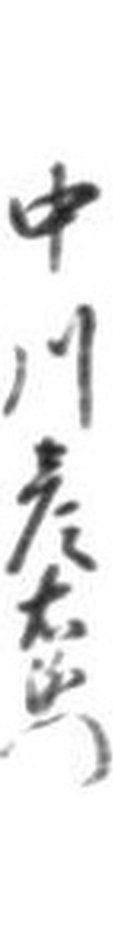中川彦右衛門
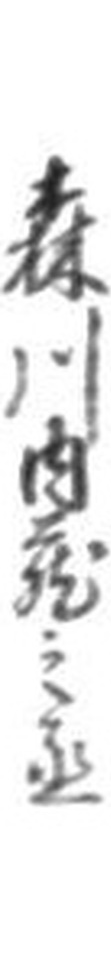森川内蔵之丞
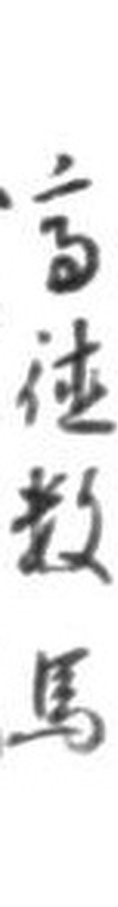高徳数馬
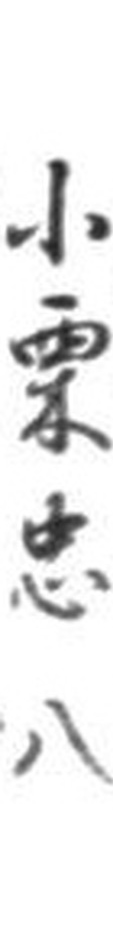小栗忠八
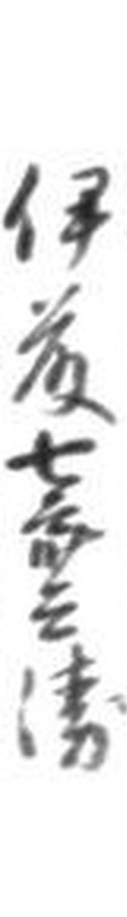伊藤七郎兵衛
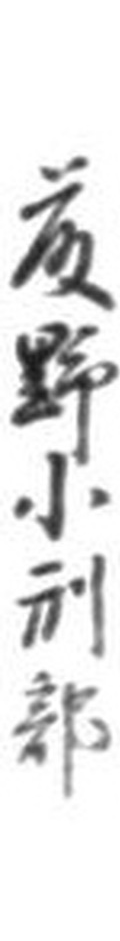藤野小刑部
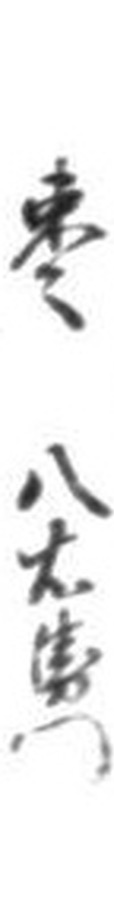棗八右衛門
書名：家譜 二 忠直公 従文禄四年到慶安四年
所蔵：福井県文書館 Fukui Prefectural Archives
